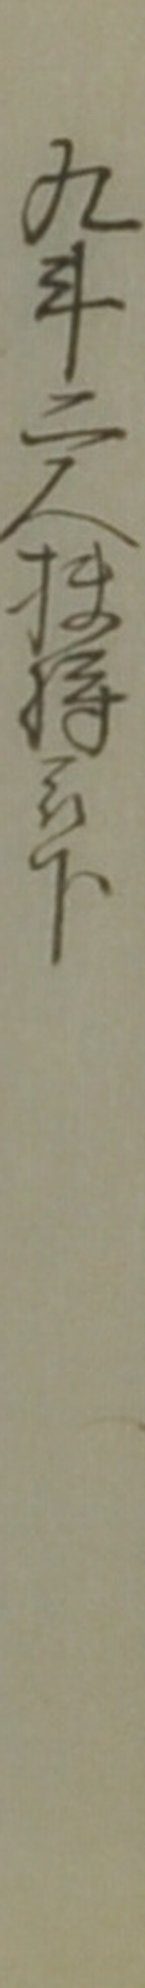九斗二人扶持被下
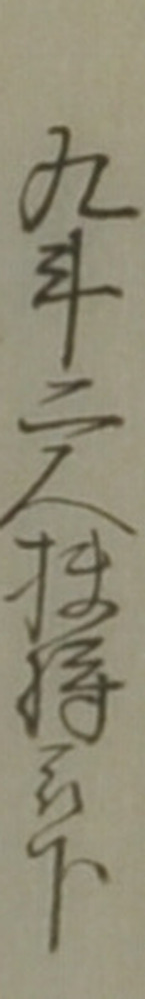九斗二人扶持被下
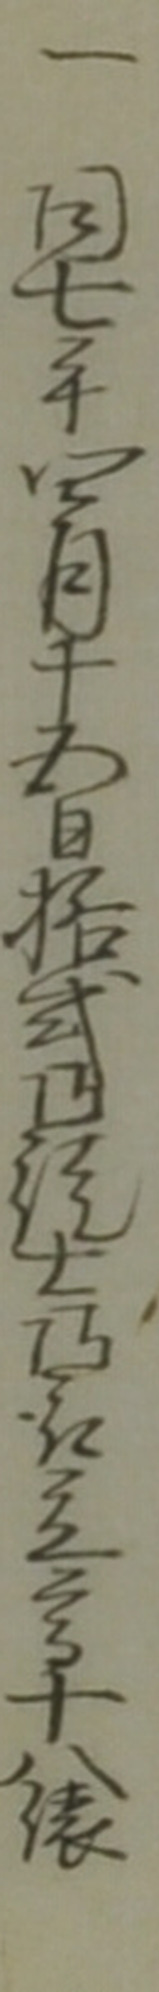一同七午四月十五日格式御徒士御取立高十八俵
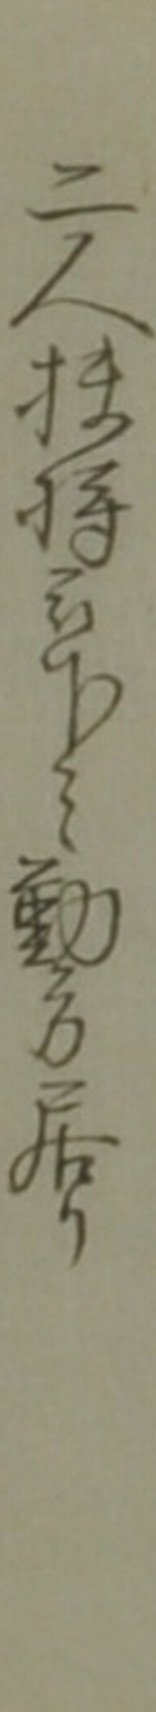二人扶持被下之勤方居リ
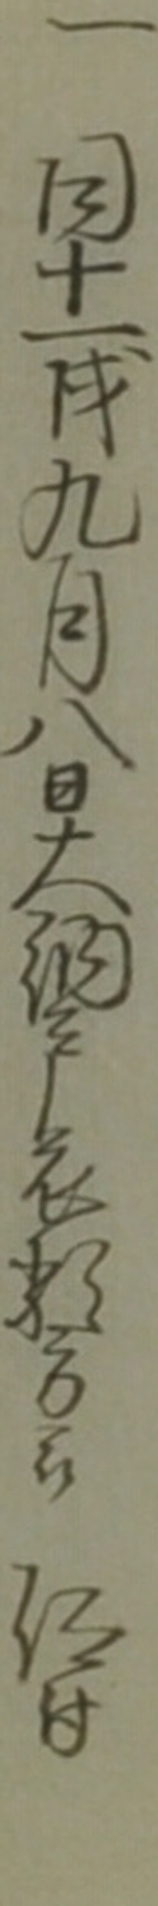一同十一戌九月八日大納戸衣類方被仰付
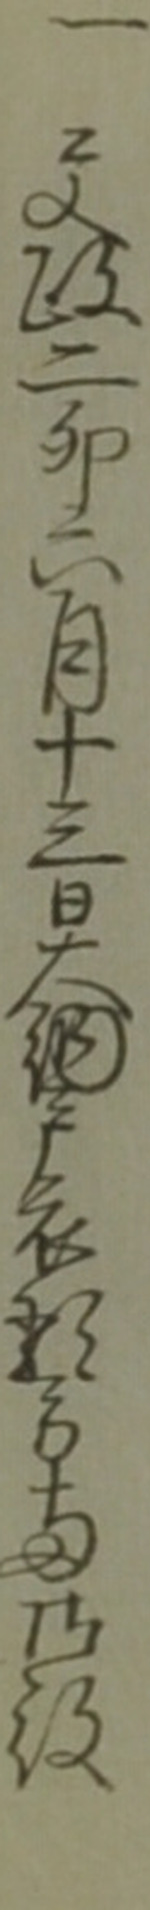一文政二卯六月十三日大納戸衣類方両御役
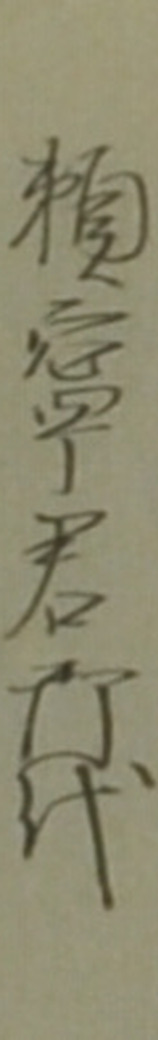頼寧君御代
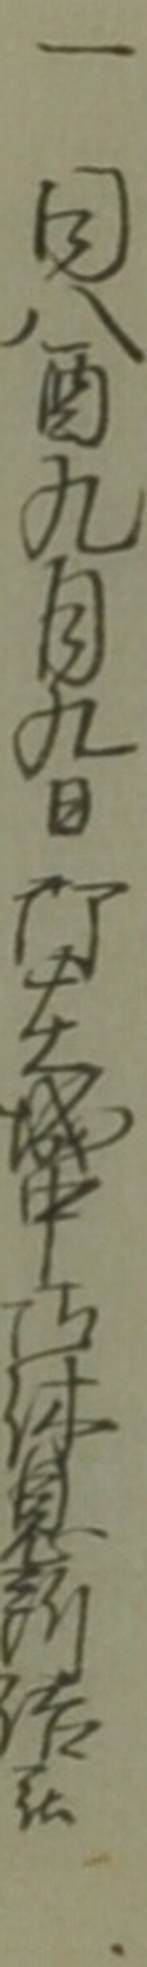一同八酉九月九日御在城中御休息所詰被
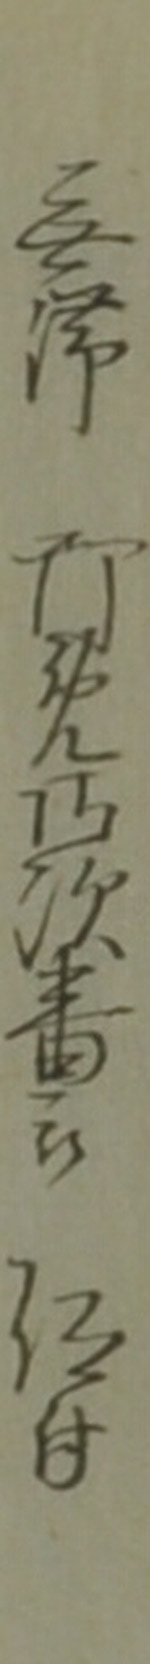無滞御免御次番被仰付
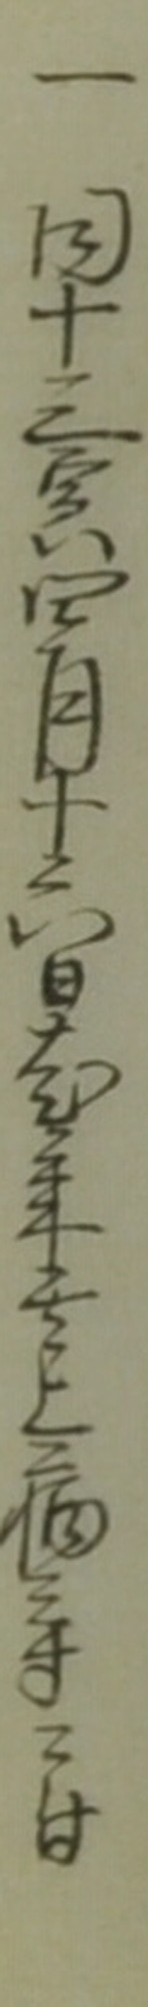一同十三寅四月十六日老年其上病気ニ付
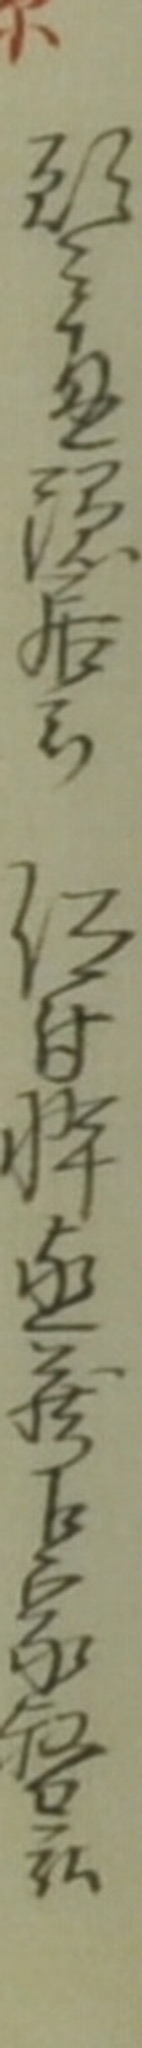願之通隠居被仰付忰与蔵江家督被

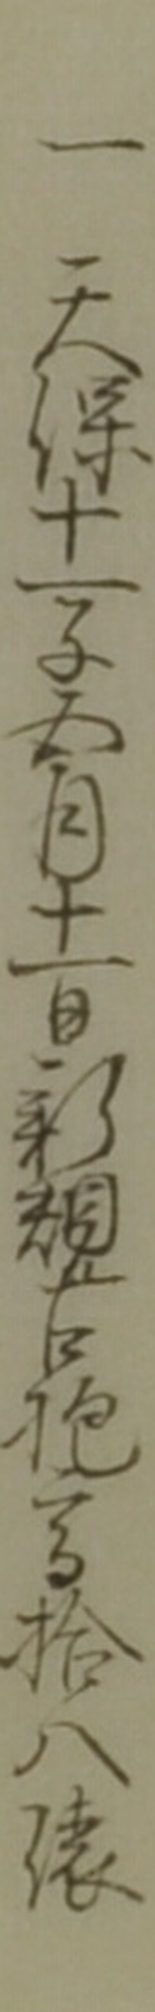一天保十一子五月十一日新規召抱高拾八俵
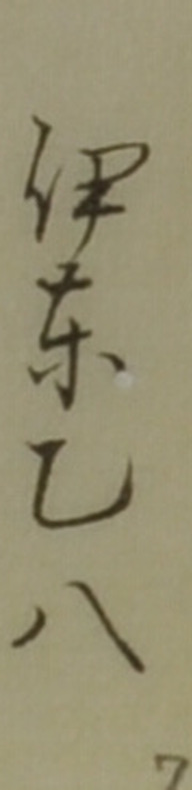伊東乙八
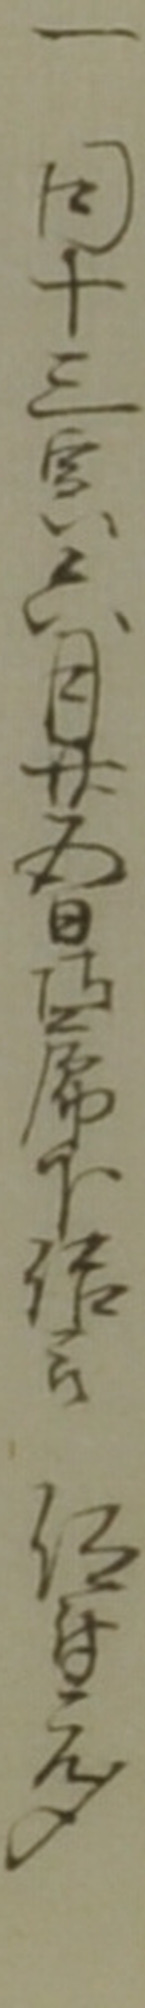一同十三寅六月廿五日御廊下詰被仰付元〆
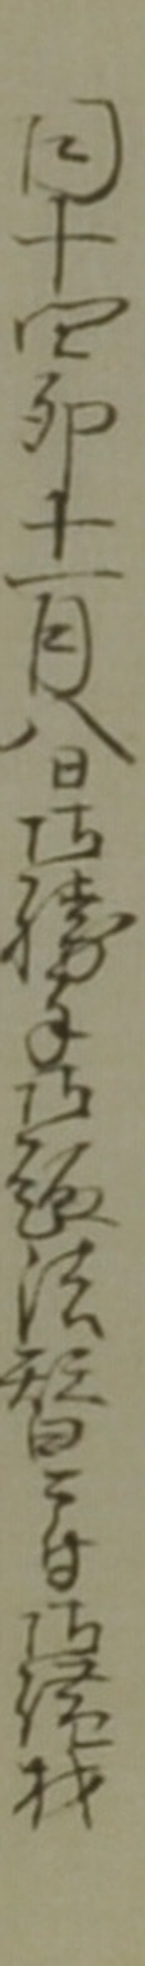一同十四卯十一月八日御勝手御趣法替ニ付御借材
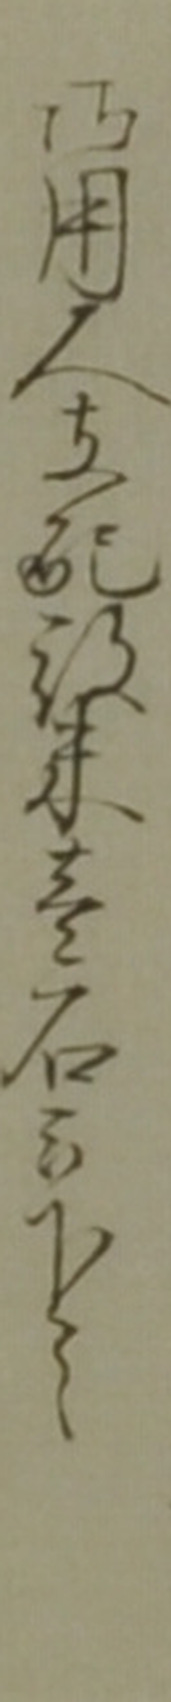御用人支配役米壱石被下之
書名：無足諸士勤仕録（八）
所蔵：伊那市立高遠町図書館・合同会社AMANE
